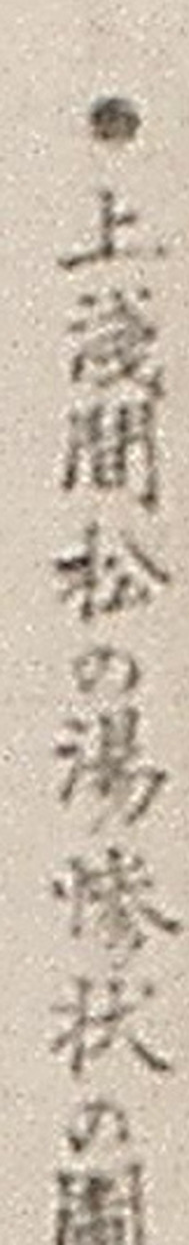●上浅間松の湯惨状の圖
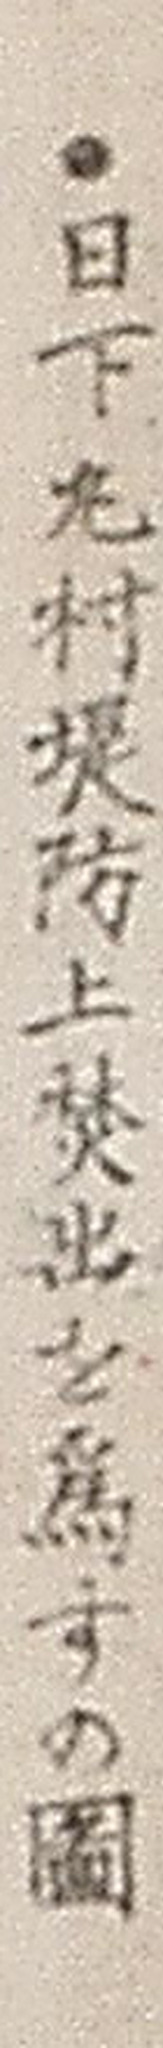●日下丸村堤防上炊出を為すの圖
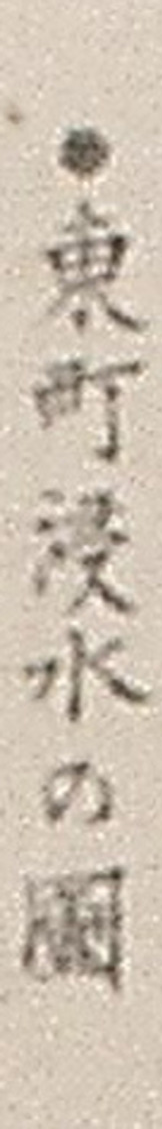●東町浸水の圖
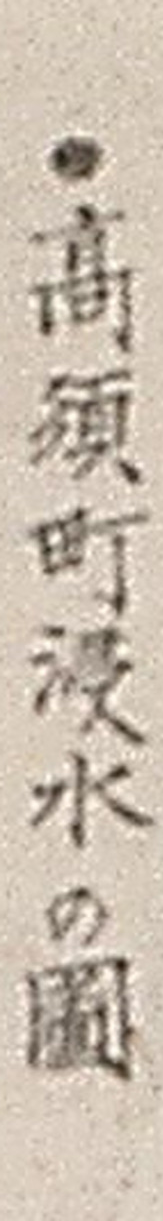●高須町浸水の圖
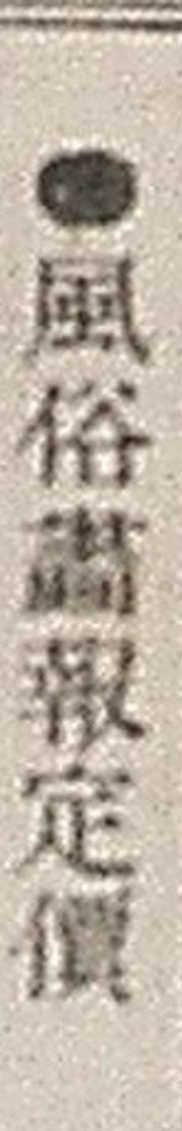●風俗畫報定価
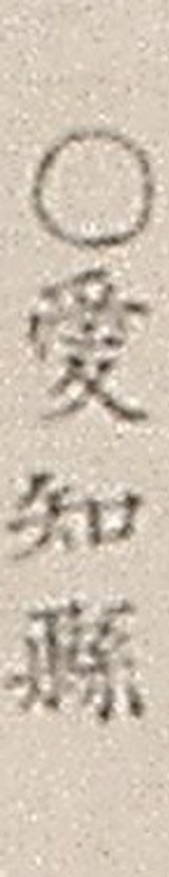◯愛知県
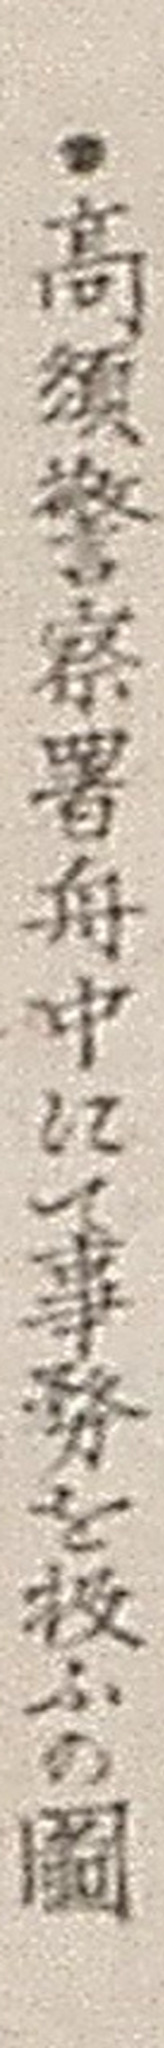●高須警察署舟中にて事務を扱ふの圖
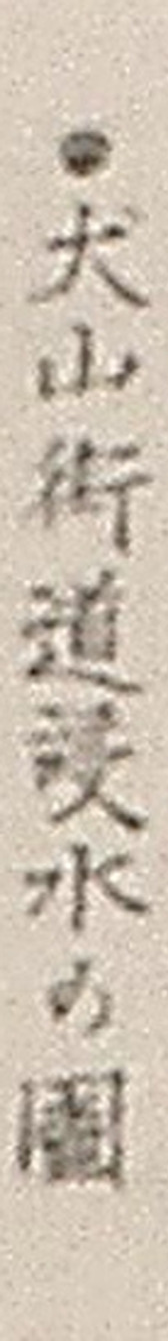●犬山街道浸水の圖
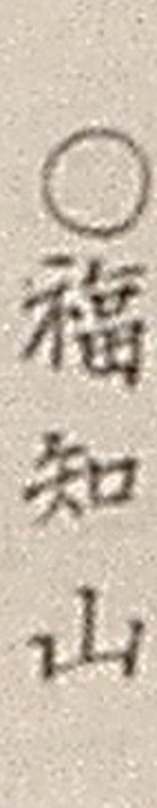◯福知山
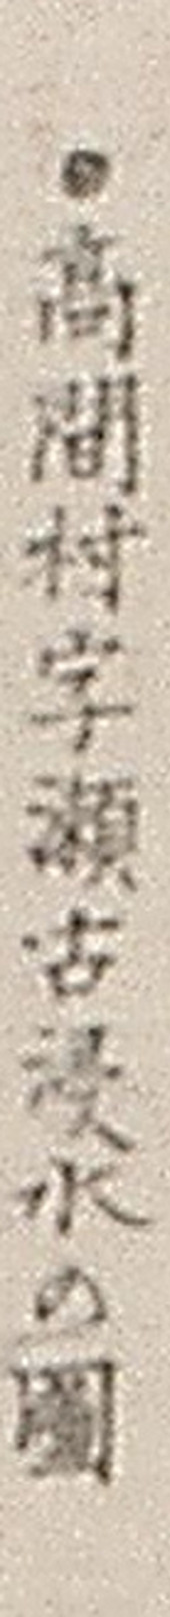●高間村字瀬古浸水の圖
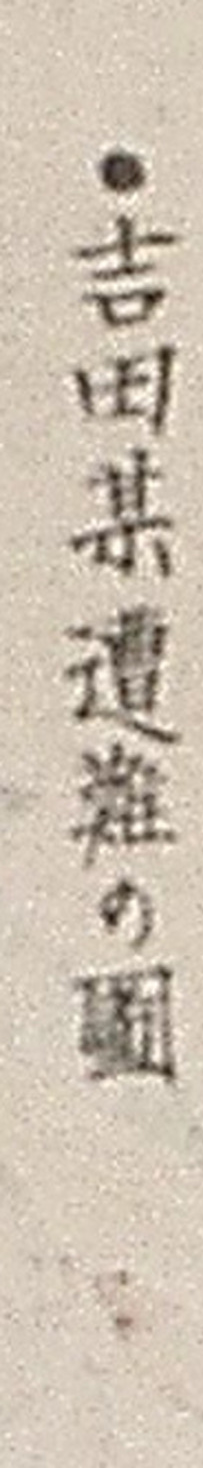●吉田某遭難の圖
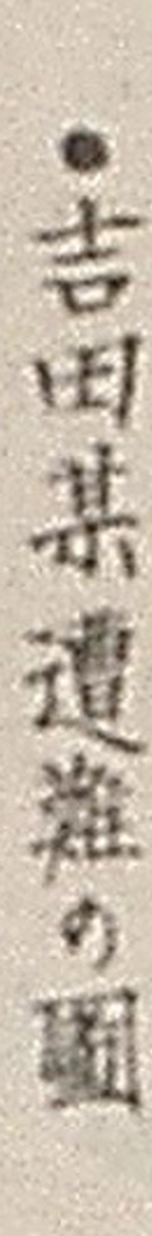●吉田某遭難の圖
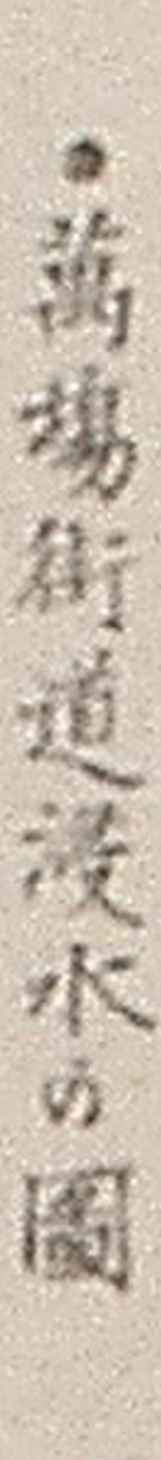●萬場街道浸水の圖
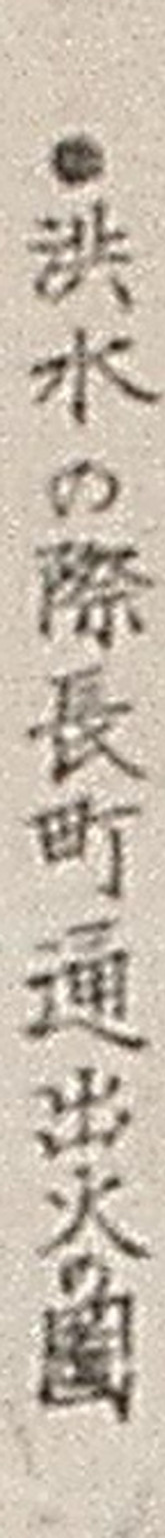●洪水の際長町通出火の圖
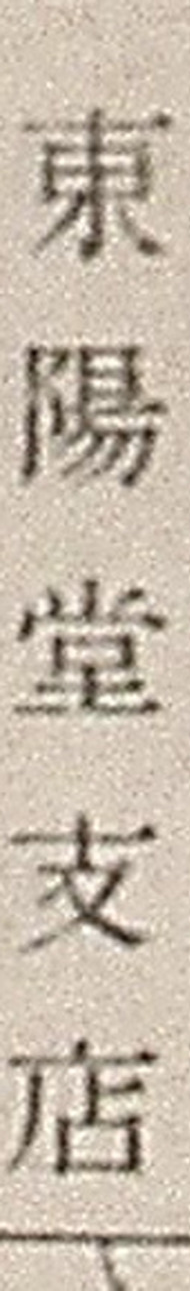東陽堂支店
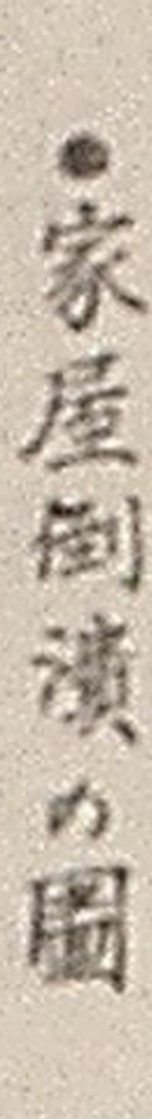●家屋戸倒潰の圖
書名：風俗畫報臨時増刊第百二十六號　洪水被害録（中）
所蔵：東京大学地震研究所図書室 Earthquake Research Institute Library, The University of Tokyo, JAPAN
